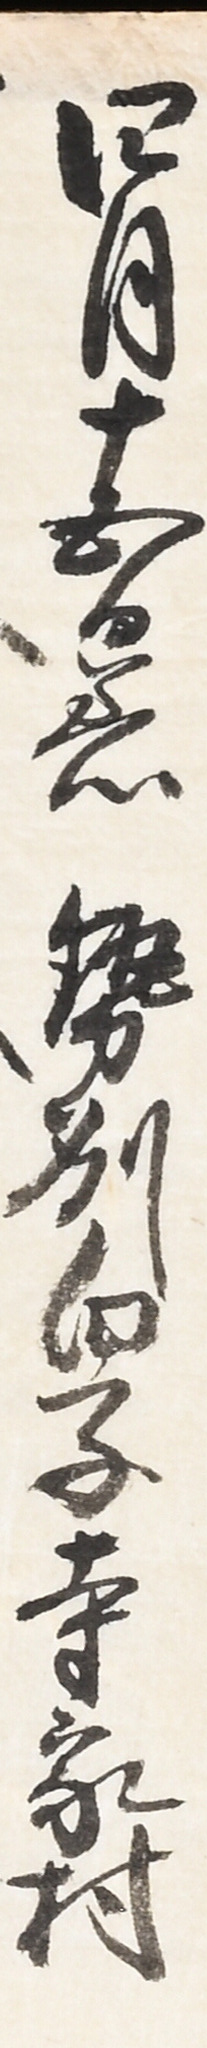四月十五日着勢州白子寺家村
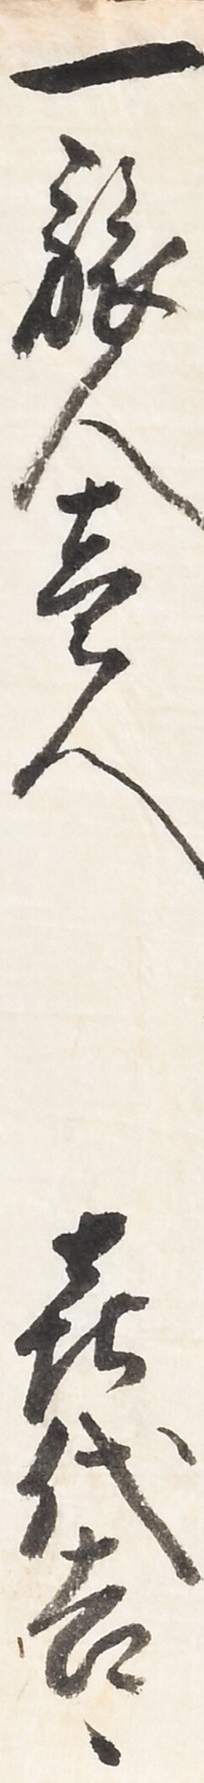一旅人壱人喜代吉・
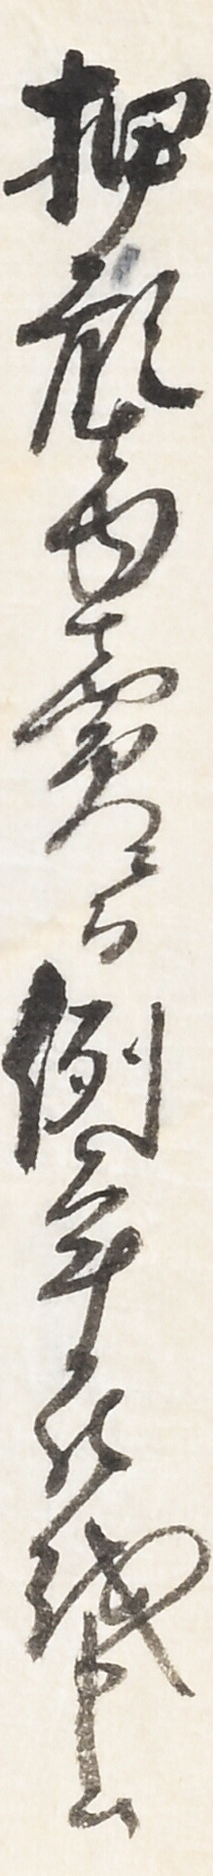押形商売ニ而例年罷越申候
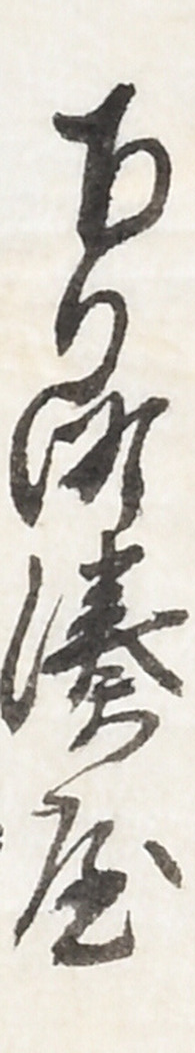下り町湊屋
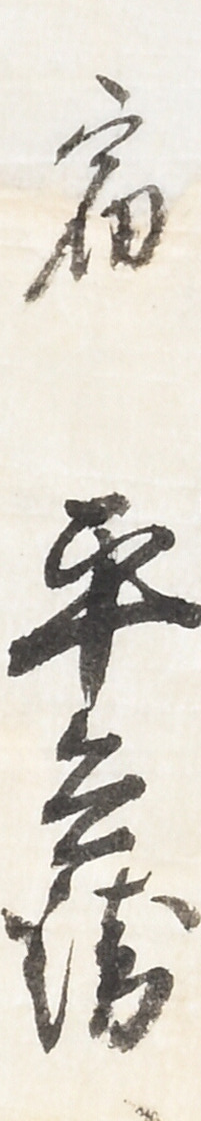宿平兵衛
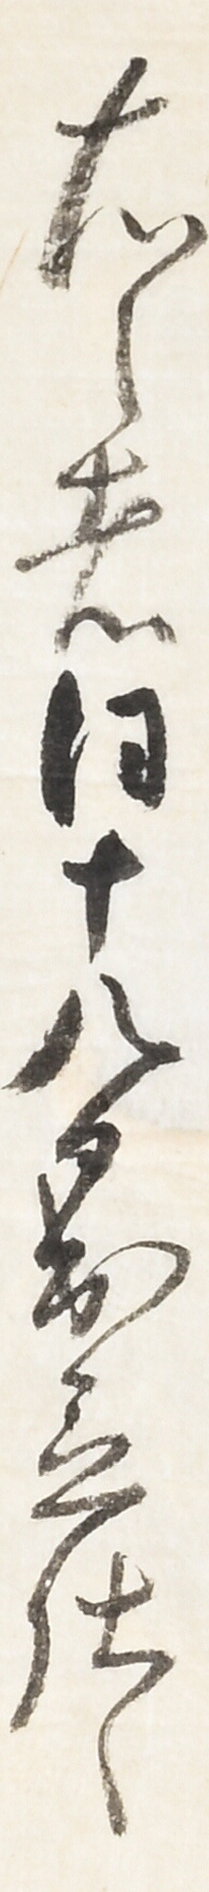右之者同十八日出立仕候
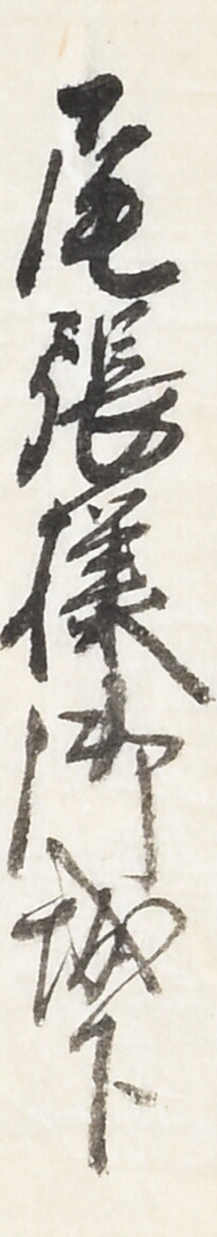尾張様御城下
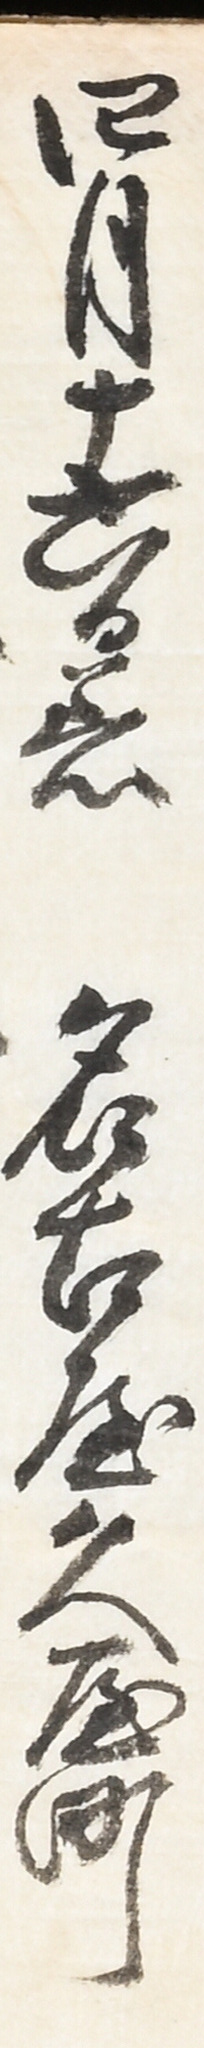四月十六日着名古屋久屋町
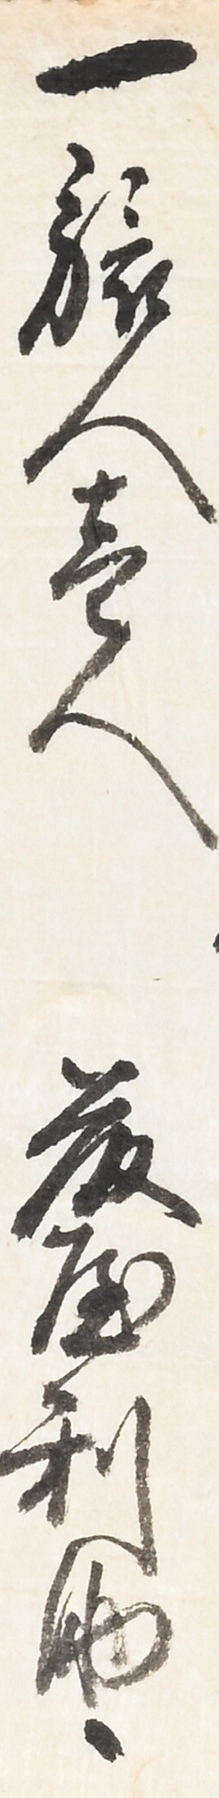一旅人壱人藤屋利助・
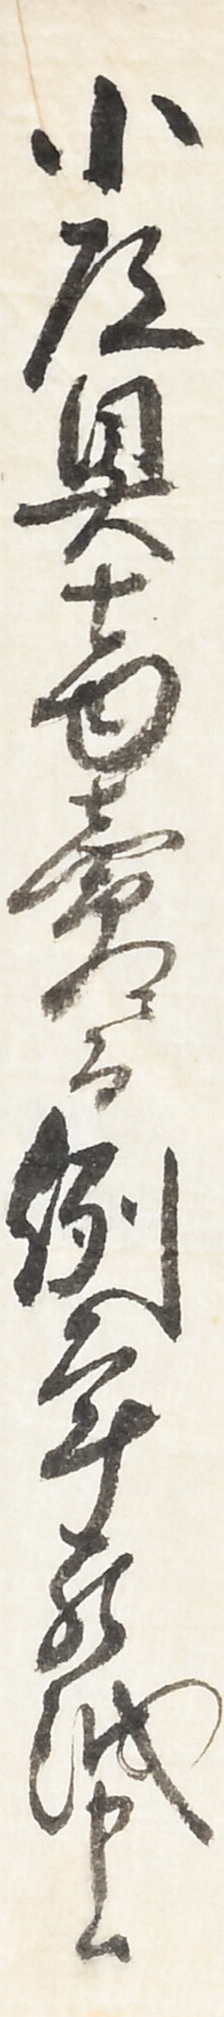小道具商売ニ而例年罷越申候
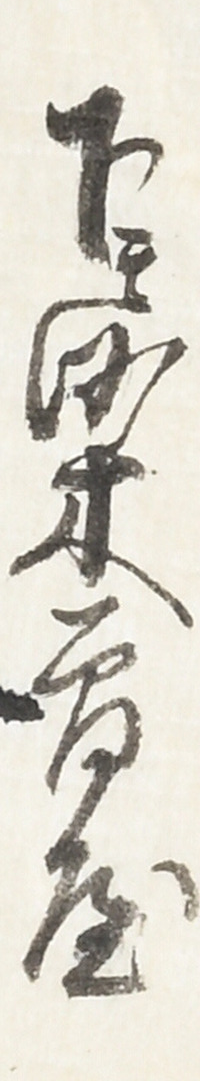下モ町木曽屋
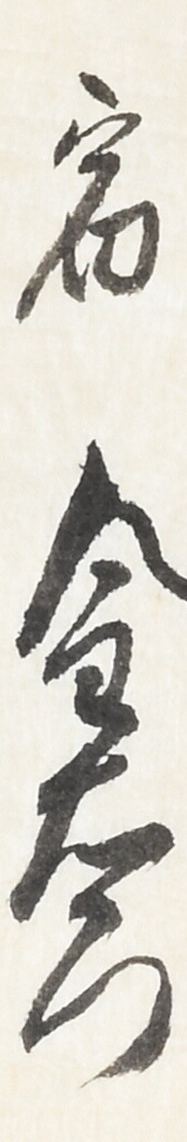宿金右衛門
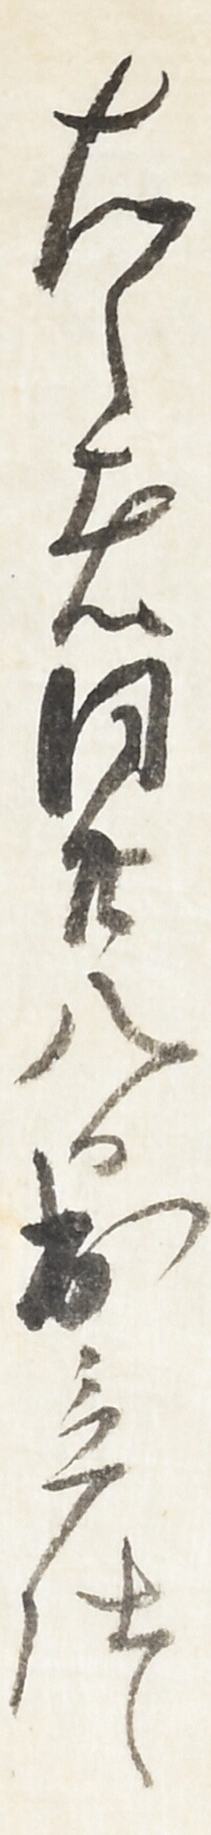右之者同廿八日出立仕候

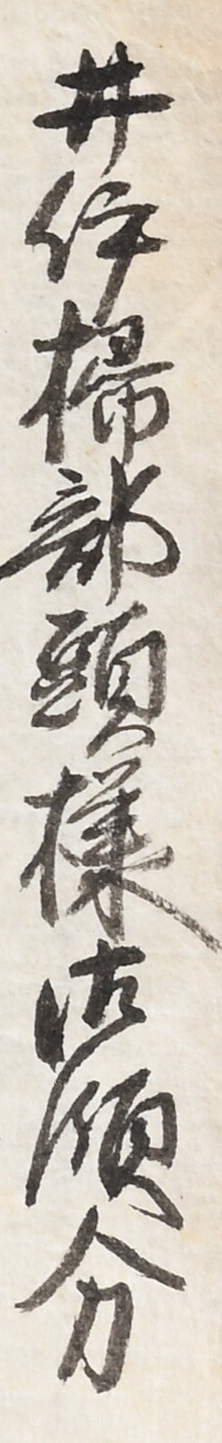井伊掃部頭様御領分
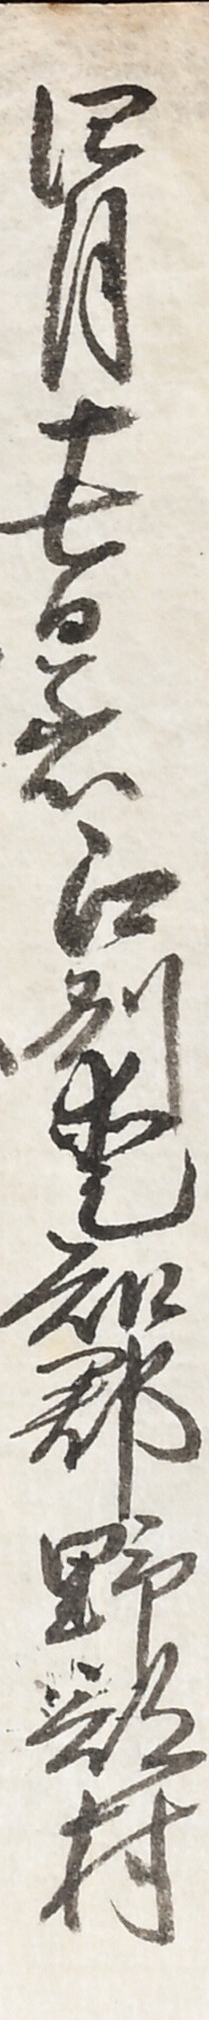四月十七日着江州愛知郡野部村
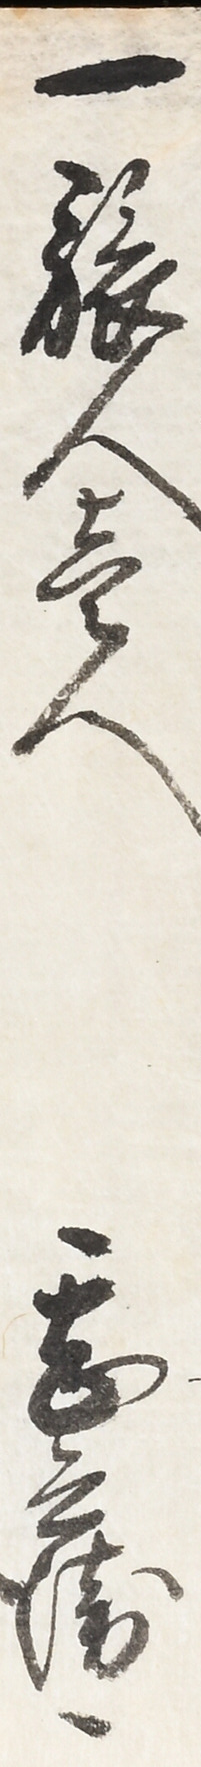一旅人壱人甚兵衛・
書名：旅人泊控帳
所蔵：伊那市立高遠町図書館・合同会社AMANE
